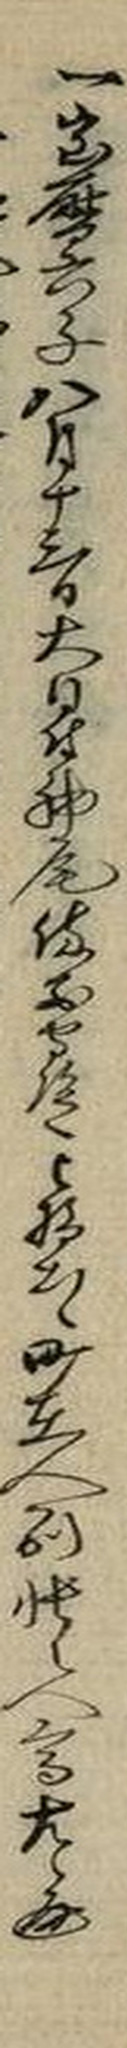一宝暦六子八月十三日大目付神尾備前守殿へ被指出候町在人別帳之人高左之通
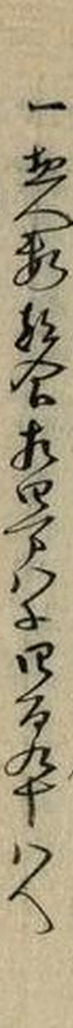一惣人数都合拾四万八千四百九十八人
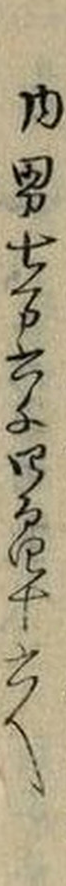内男七万六千四百四十六人
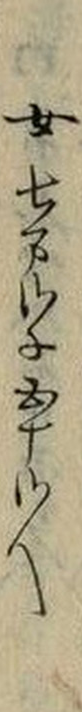女七万弐千五十弐人
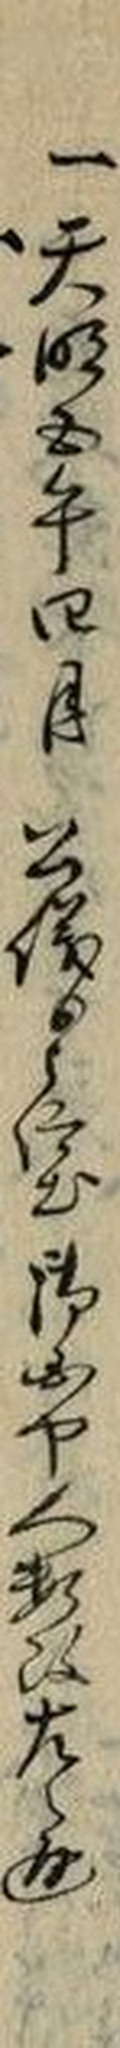一天明五午四月公儀ゟ被仰出御国中人数改左之通
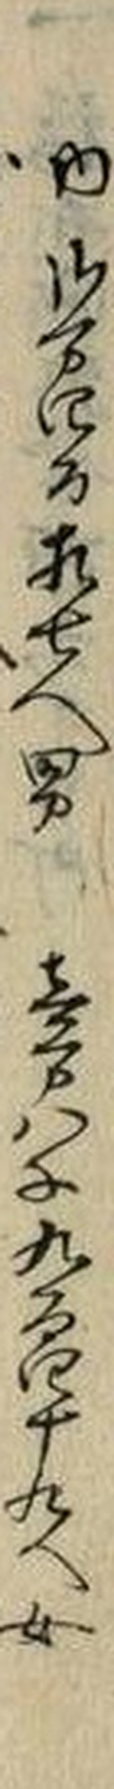内弐万四百拾七人男壱万八千九百四十九人女
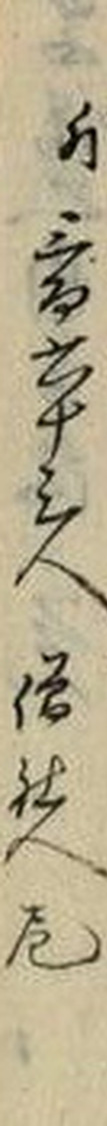外三百六十三人僧社人尼
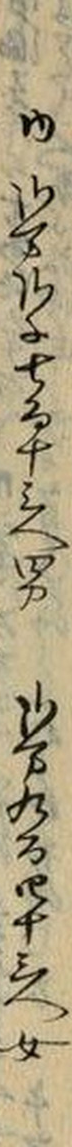内弐万弐千七百十三人男弐万九百四十三人女
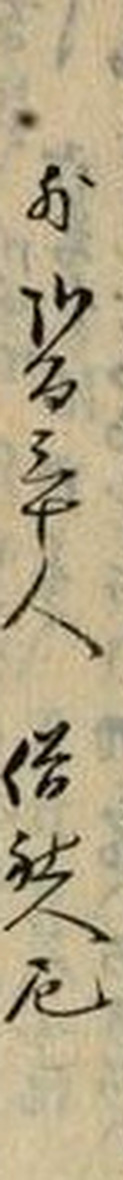外弐百三十人僧社人尼
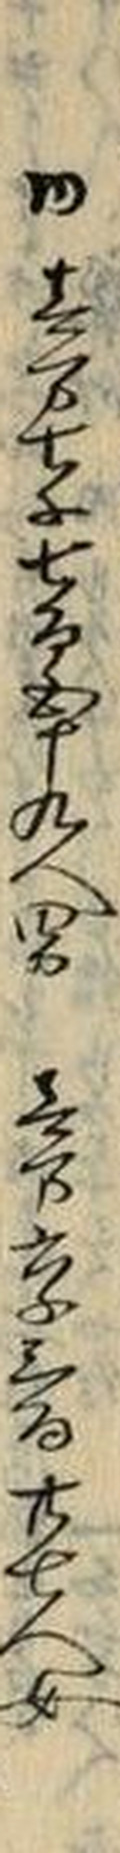内壱万七千七百五十九人男壱万六千三百廿七人女
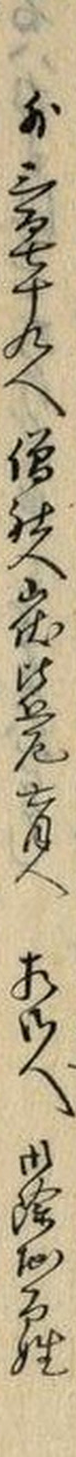外三百七十九人僧社人山伏比丘尼盲人拾弐人御除地百姓
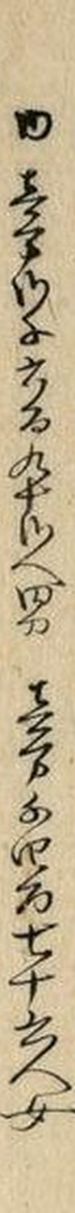内壱万弐千六百九十弐人男壱万千四百七十六人女
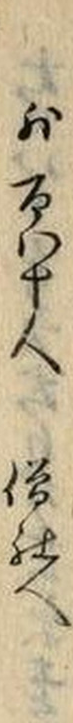外百八十人僧社人
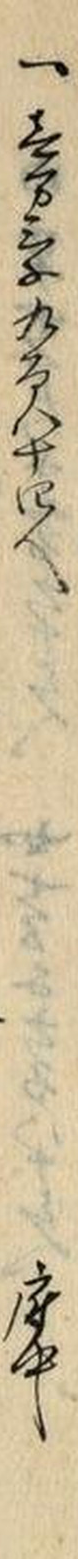一壱万三千九百八十四人府中
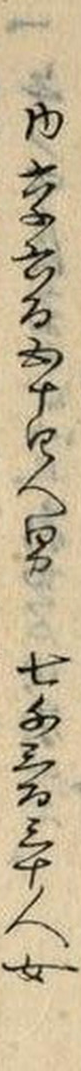内六千六百五十四人男七千三百三十人女
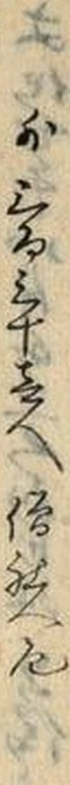外三百三十壱人僧社人尼
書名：御国他国諸事之部
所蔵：福井県文書館 Fukui Prefectural Archives
